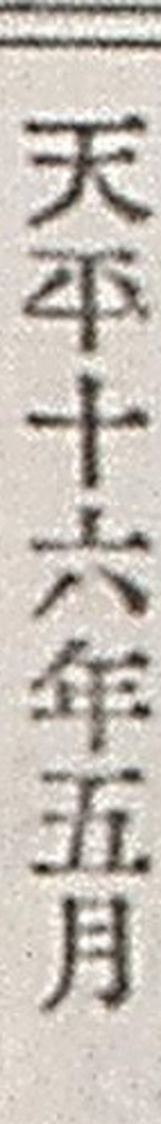天平十六年五月
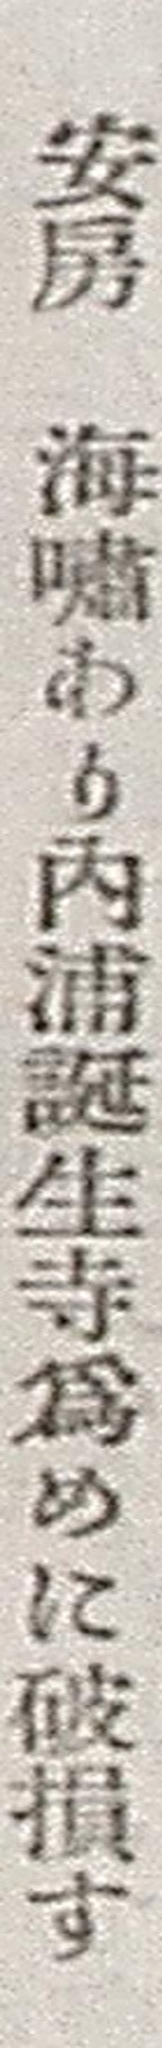安房海嘯あり内浦誕生寺為めに破損す
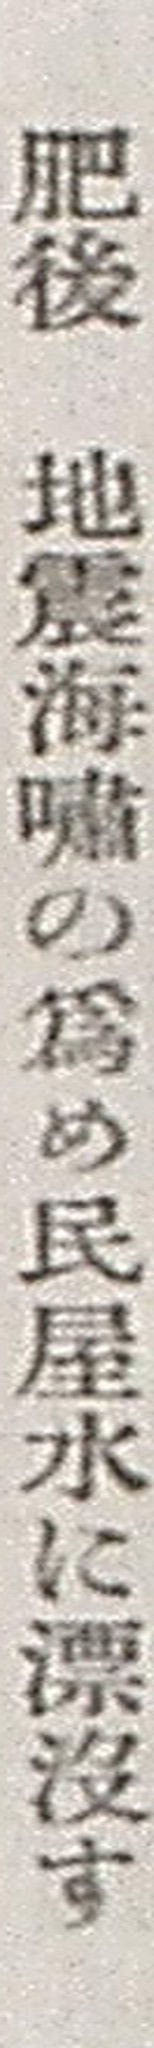肥後地震海嘯の為め民屋水に漂没す
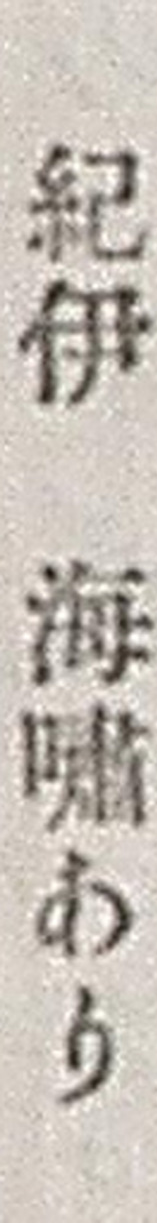紀伊海嘯あり
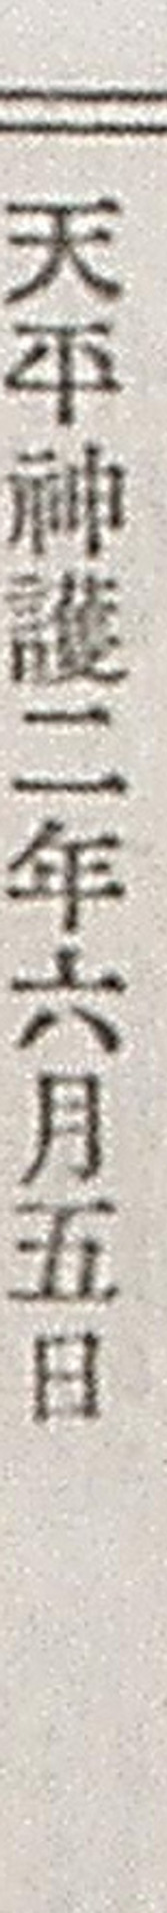天平神護二年六月五日
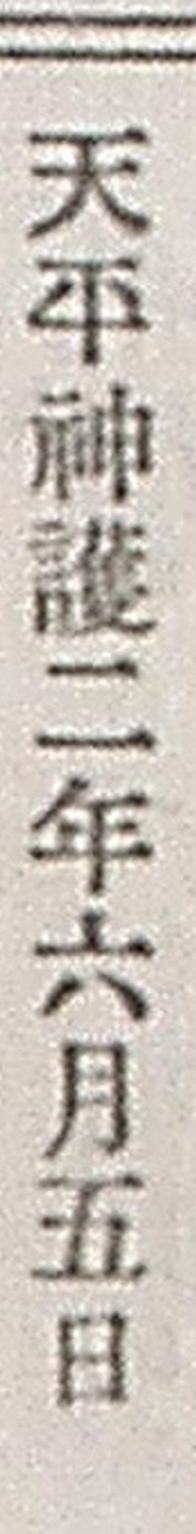天平神護二年六月五日
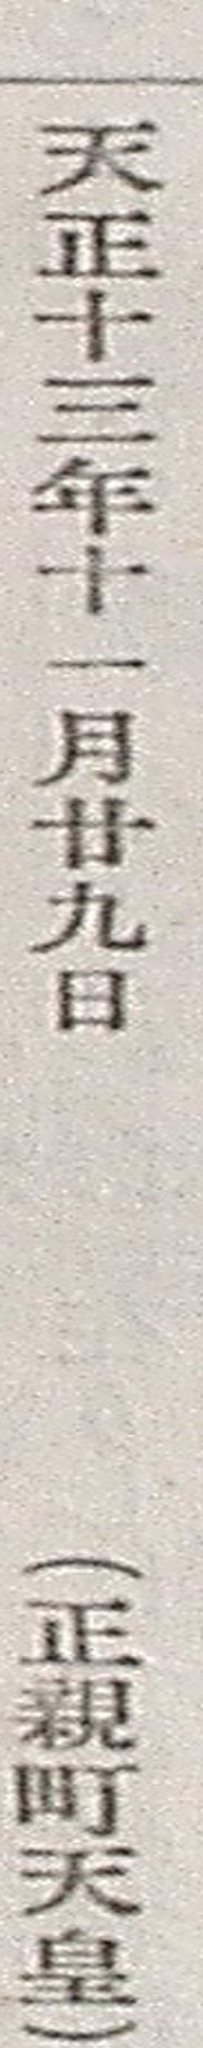天正十三年十一月廿九日
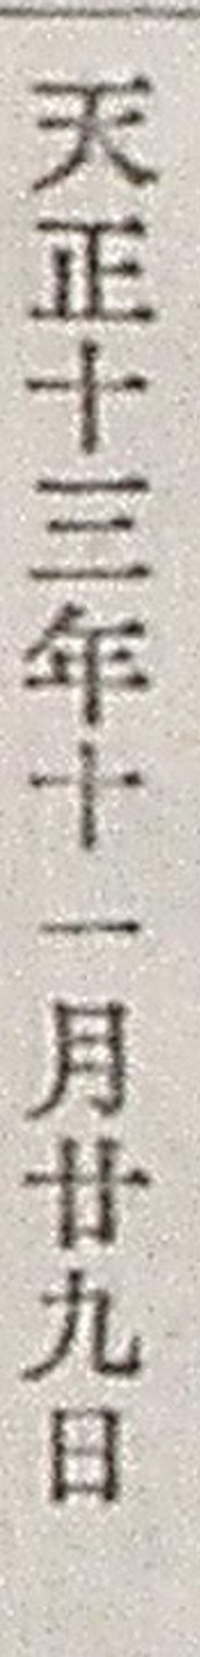天正十三年十一月廿九日
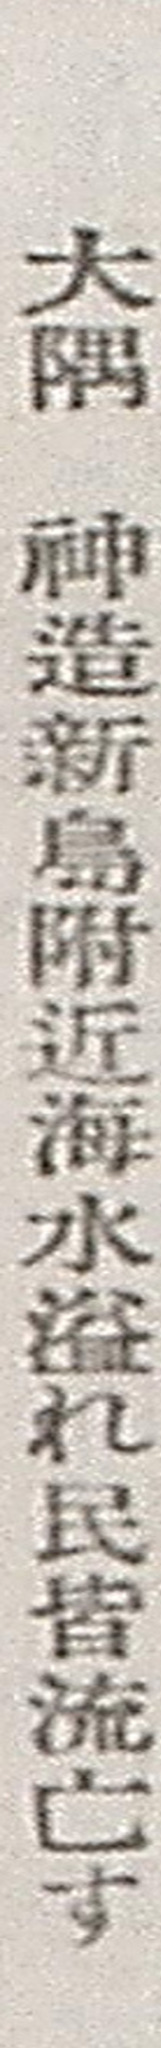大隅神造新島付近海水溢れ民皆流亡す
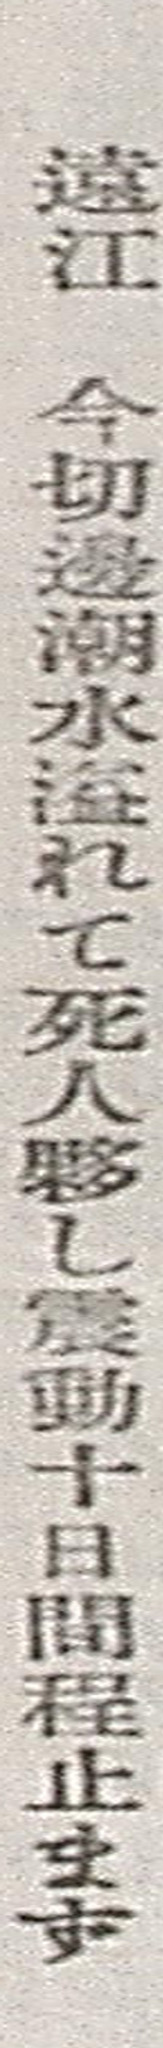遠江今切辺潮水溢れて死人夥し震動十日間程止まず
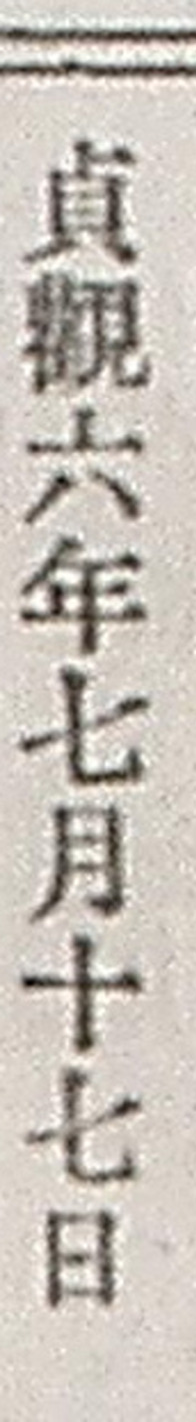貞観六年七月十七日
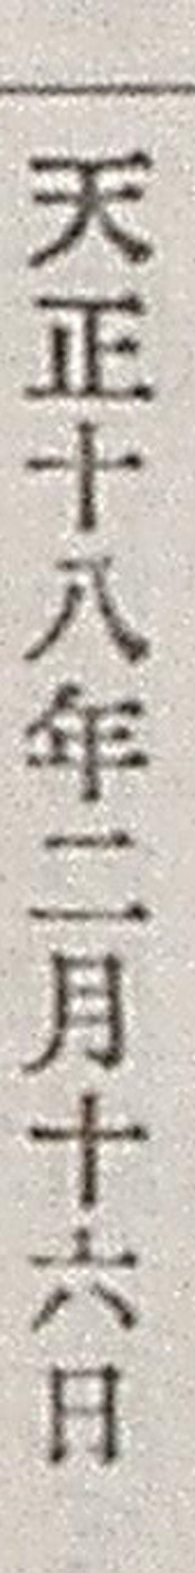天正十八年二月十六日
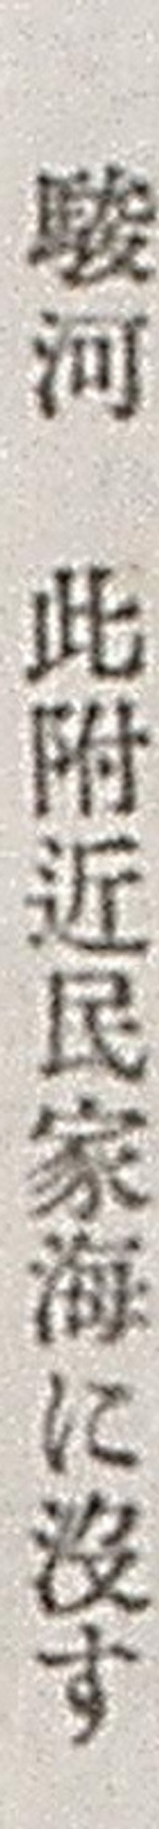駿河此付近民家海に没す
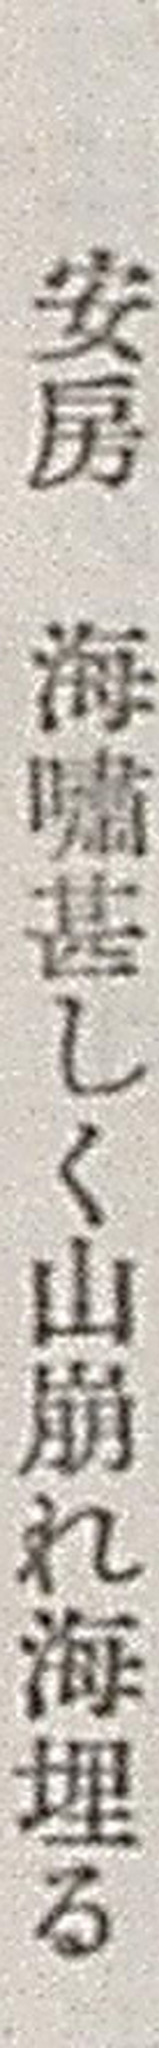安房海嘯甚しく山崩れ埋る
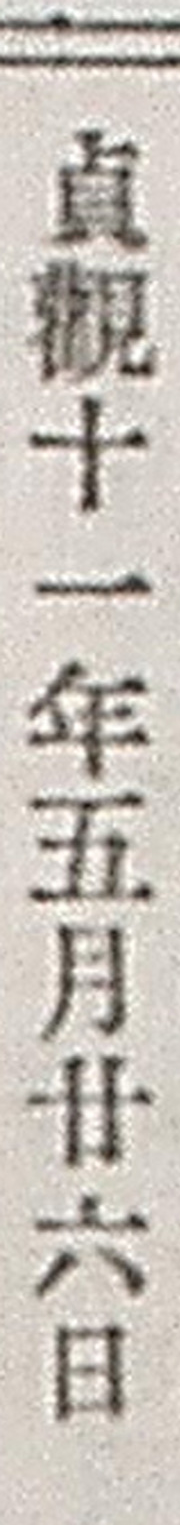貞観十一年五月廿六日
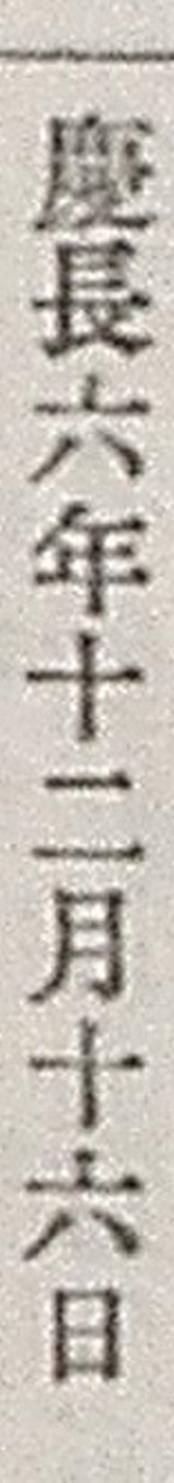慶長六年十二月十六日
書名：風俗畫報臨時増刊第百二十號　大海嘯被害録（下）
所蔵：東京大学地震研究所図書室 Earthquake Research Institute Library, The University of Tokyo, JAPAN
